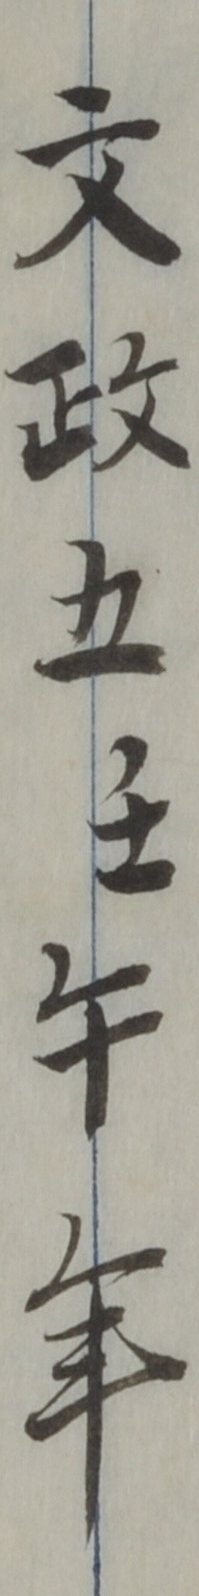文政五壬午年
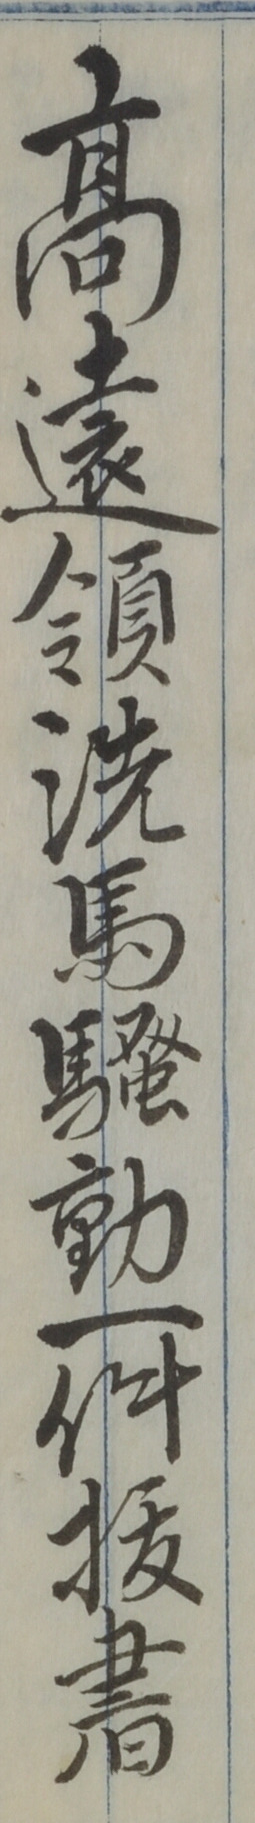高遠領洗馬騒動一件抜書
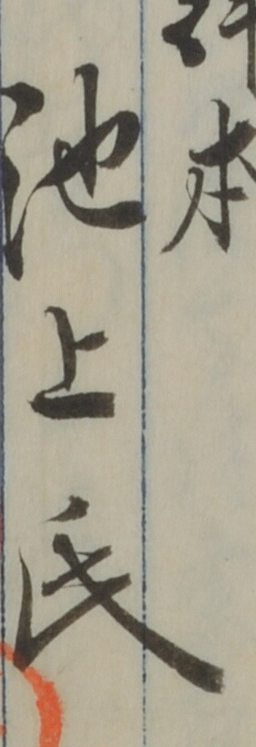池上氏

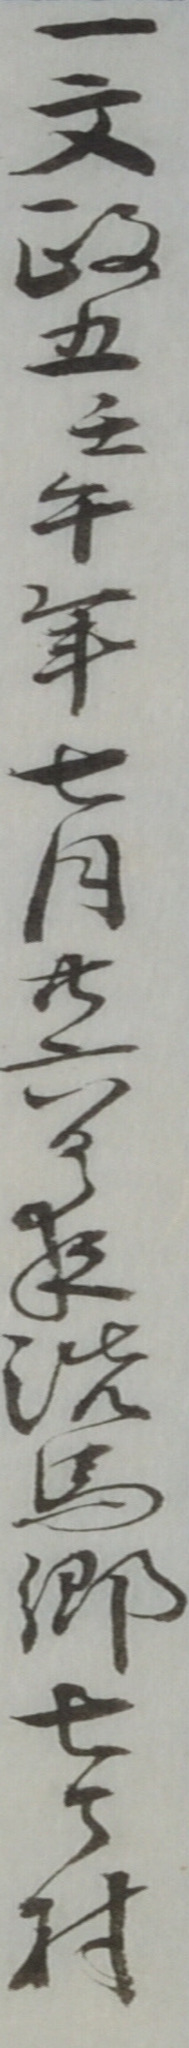一文政五壬午年七月廿六日夜洗馬郷七ヶ村
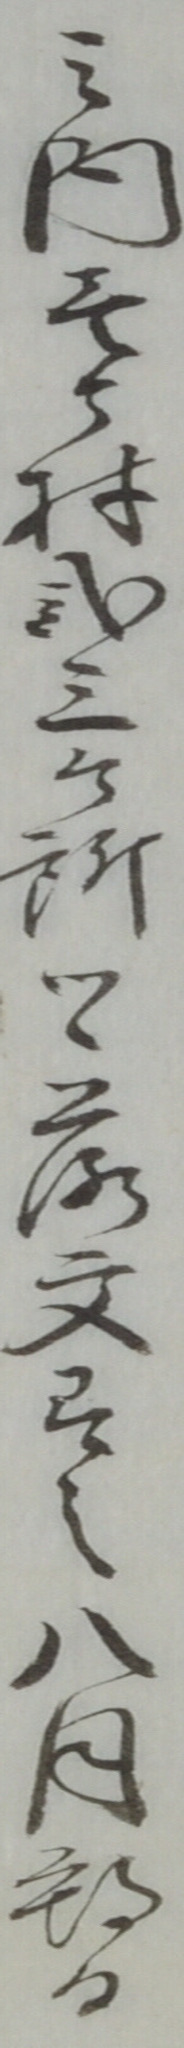之内壱ヶ村弐三ヶ所ツヽ落文有之八月朔日
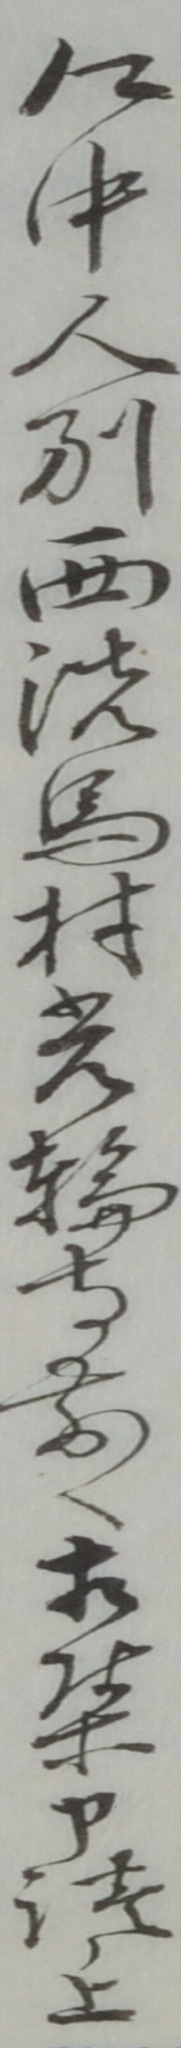郷中人別西洗馬村光輪寺前へ相集申談ノ上
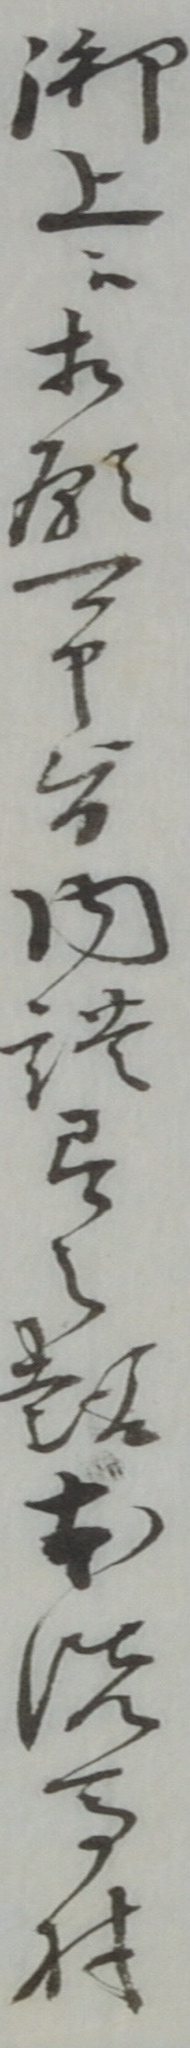御上江相願可申旨内談有之趣本洗馬村
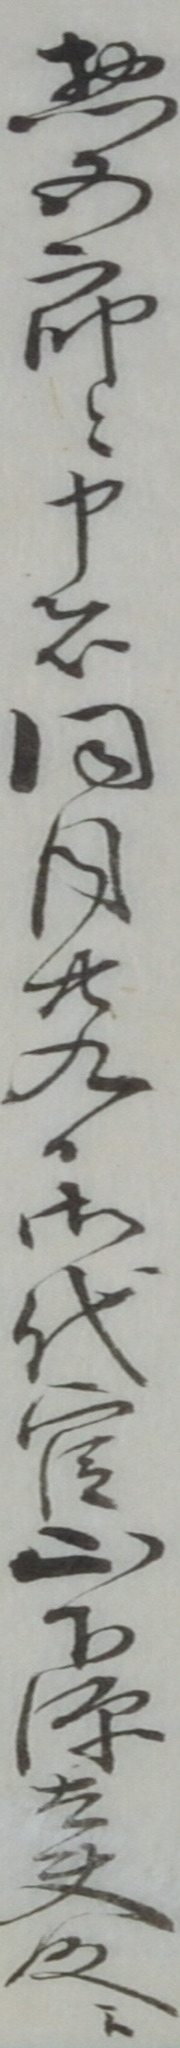惣五郎と申者同月廿九日御代官山下源太夫殿江
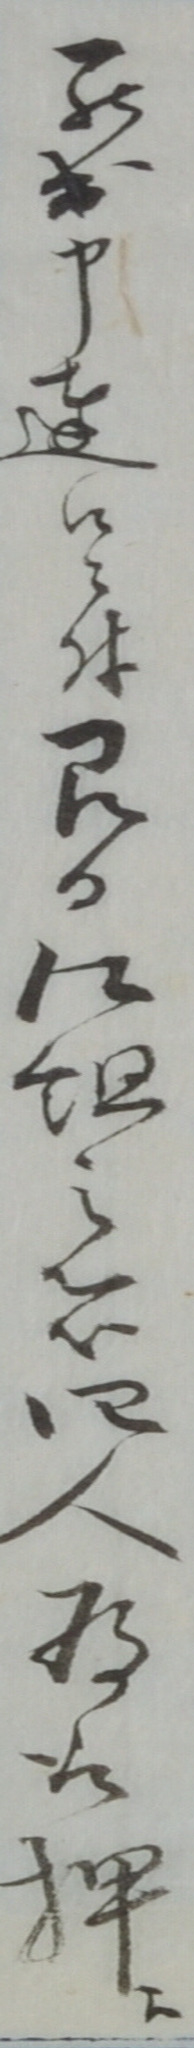罷出申達候ニ付即日郷組之者四人為取押江
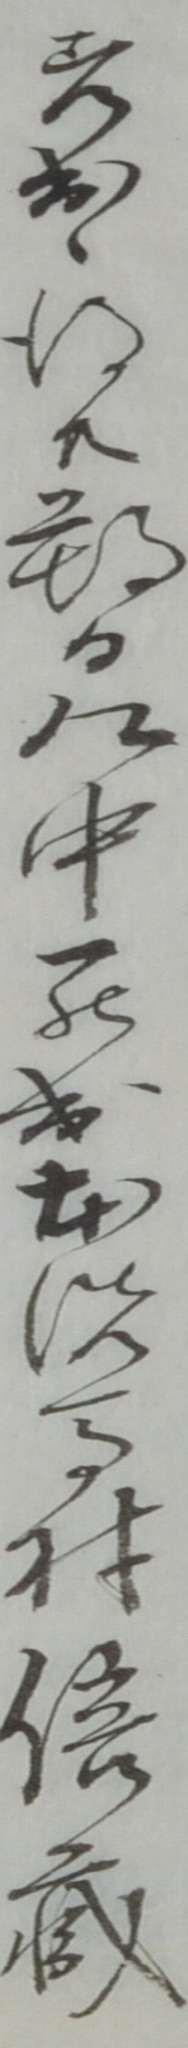差出候得共朔日郷中罷出本洗馬村信蔵
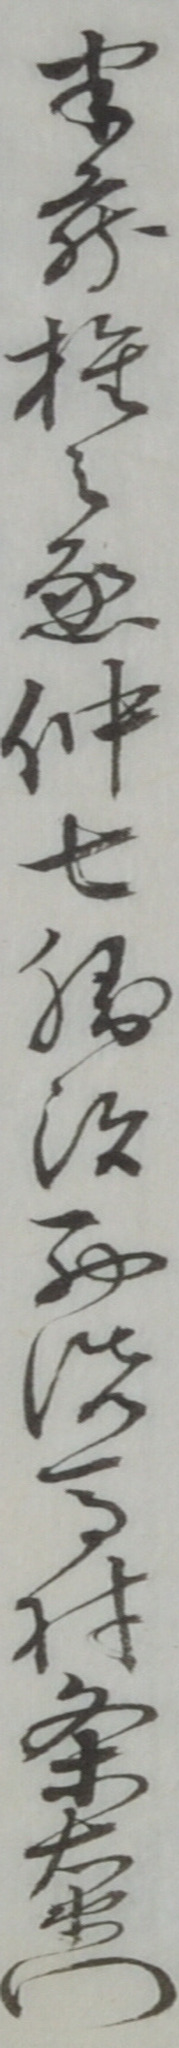半蔵権之丞仲七勝治西洗馬村条右衛門
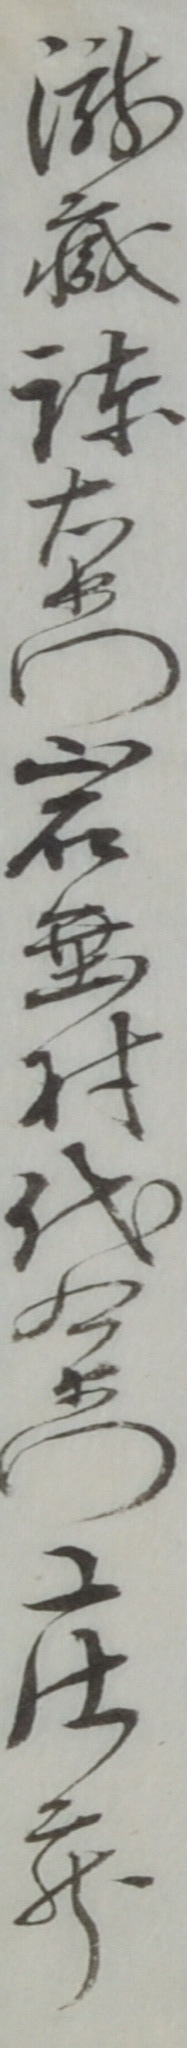瀧蔵諫右衛門岩垂村代右衛門庄蔵
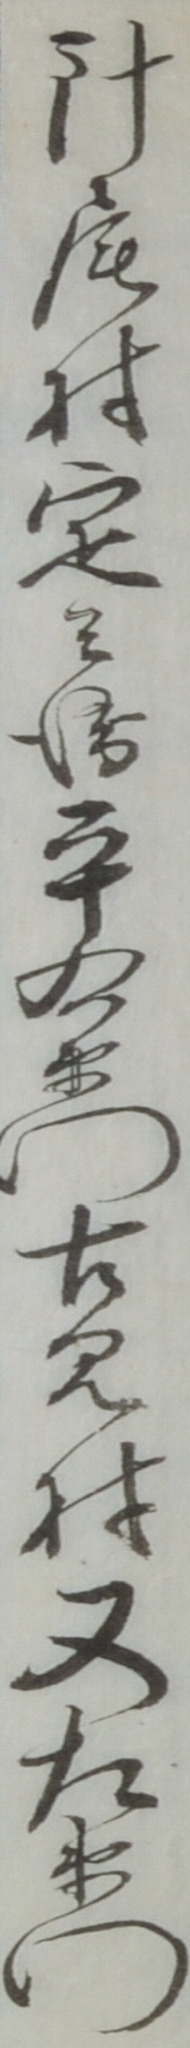針尾村定兵衛平右衛門古見村又左衛門

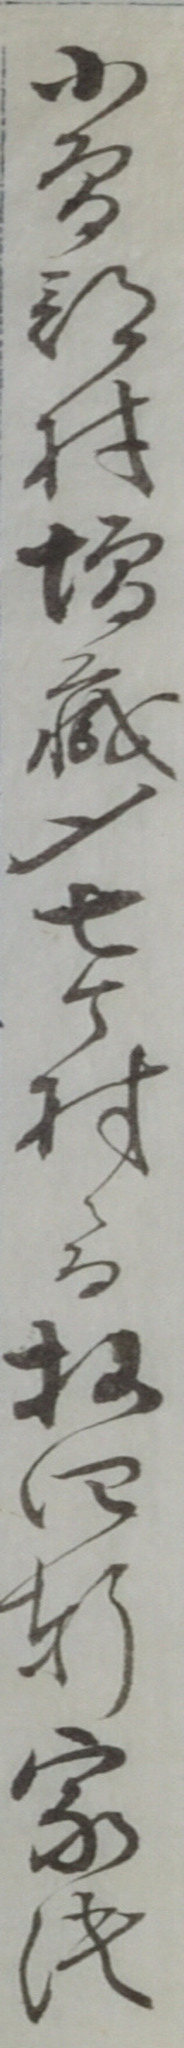小曽部村増蔵〆七ヶ村ニ而拾四軒家潰
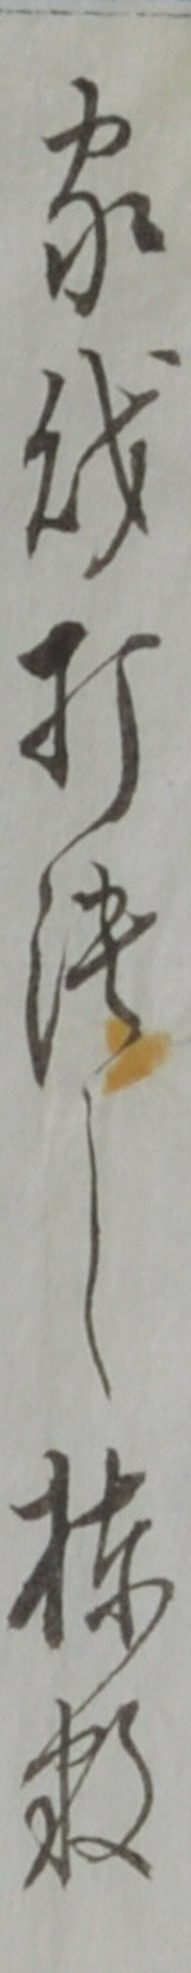家財打潰し棟数
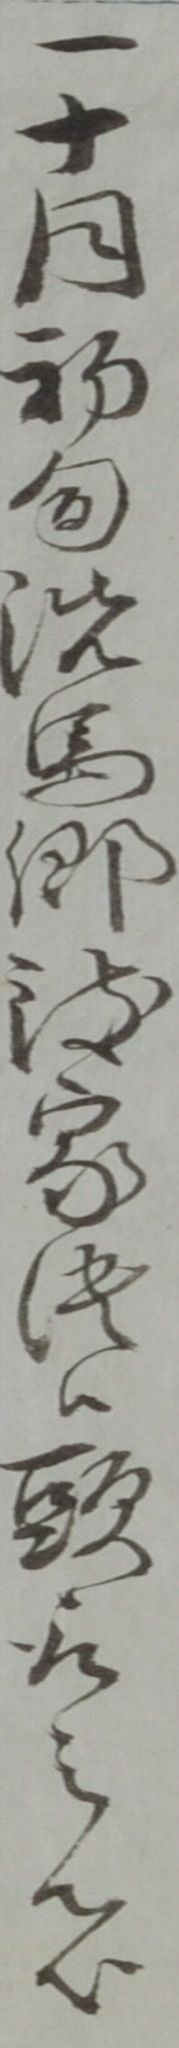一十月初旬洗馬郷致家潰候頭取之者
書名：高遠領洗馬騒動一件抜書
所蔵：伊那市立高遠町図書館・合同会社AMANE
